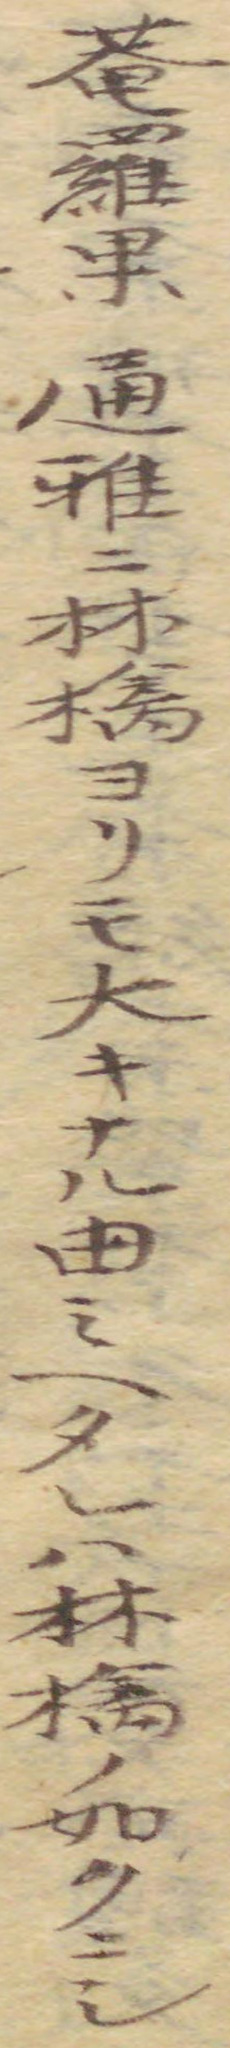菴羅果通雅ニ林檎ヨリモ大キナル由ミヘタレハ林檎ノ如クニシ
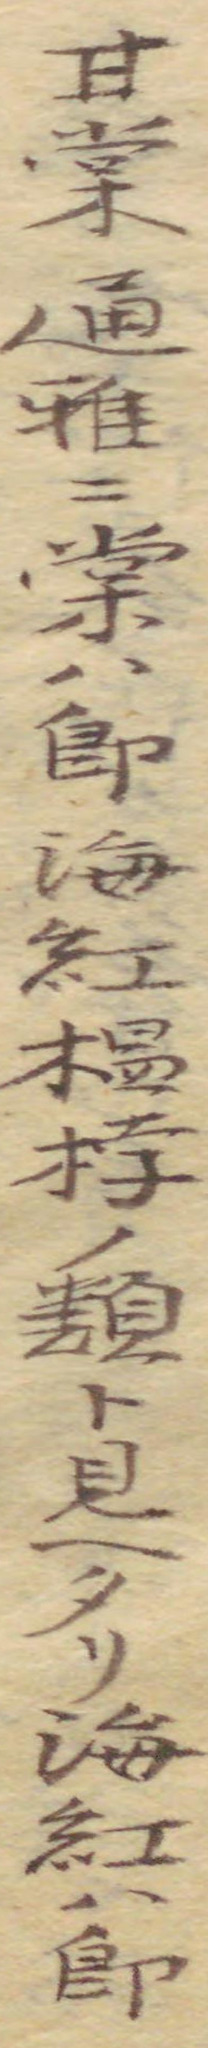甘棠通雅ニ棠ハ即海紅榲桲ノ類ト見ヘタリ海紅ハ即
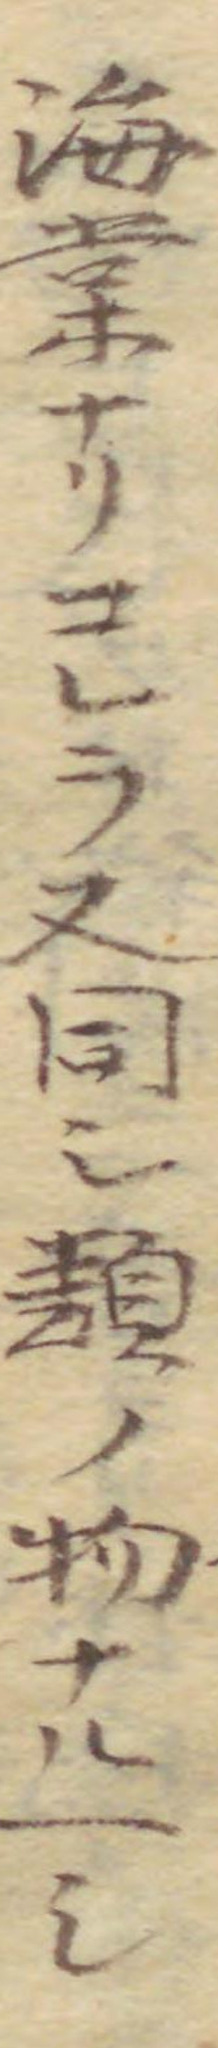海棠ナリコレラ又同シ類ノ物ナルヘシ
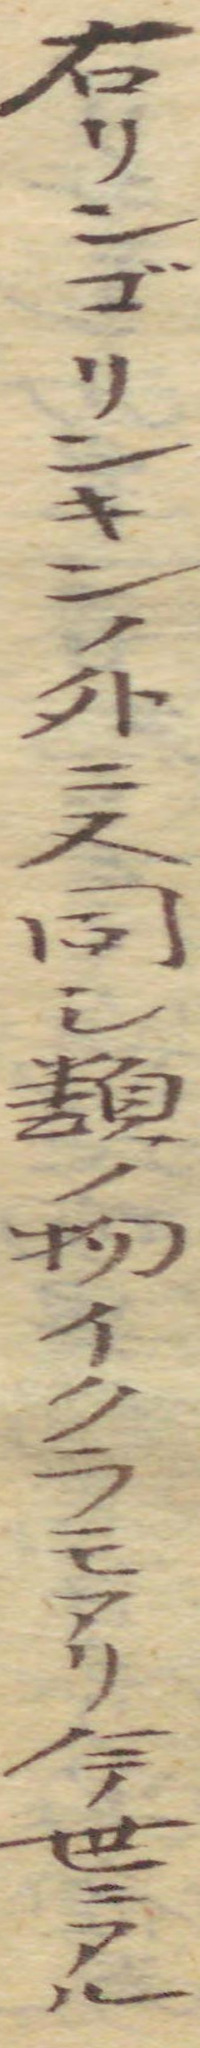右リンゴリンキンノ外ニ又同シ類ノ物イクラモアリ今世ニアル
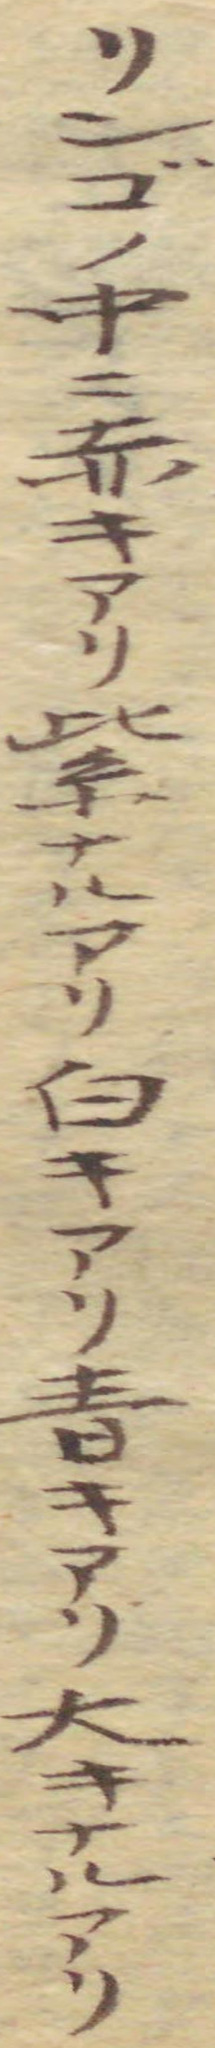リンゴノ中ニ赤キアリ紫ナルアリ白キアリ青キアリ大キナルアリ
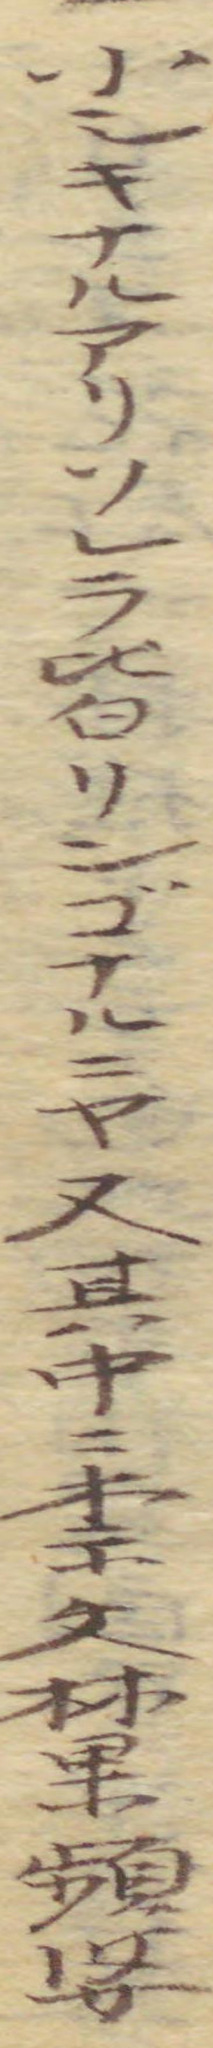小シキナルアリソレラ皆リンゴナルニヤ又其中ニ柰文林果頻婆
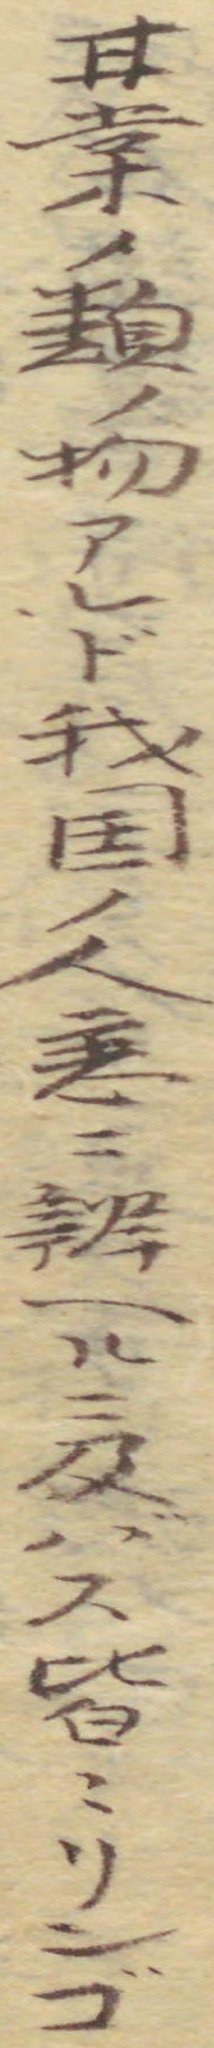甘棠ノ類ノ物アレド我国ノ人悉ニ弁ヘルニ及ハス皆〻リンゴ
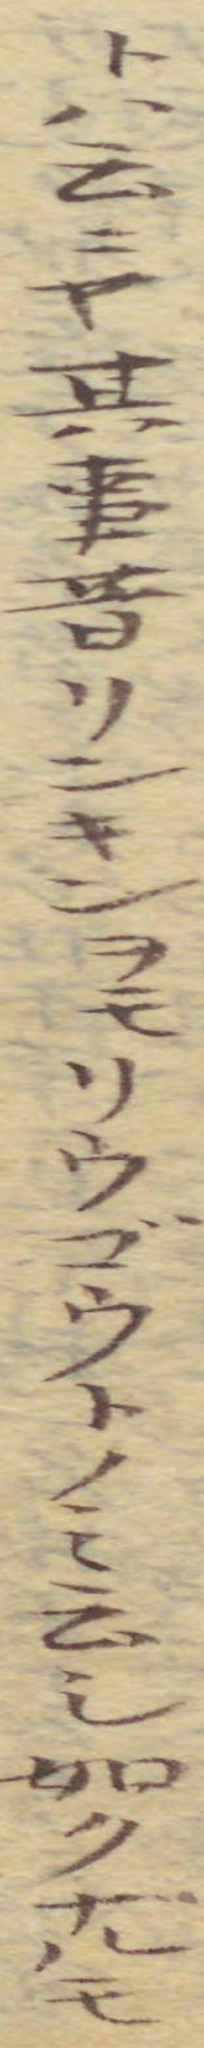トハ云ニヤ其事昔リンキンヲモリウゴウトノミ云シ如クナルモ
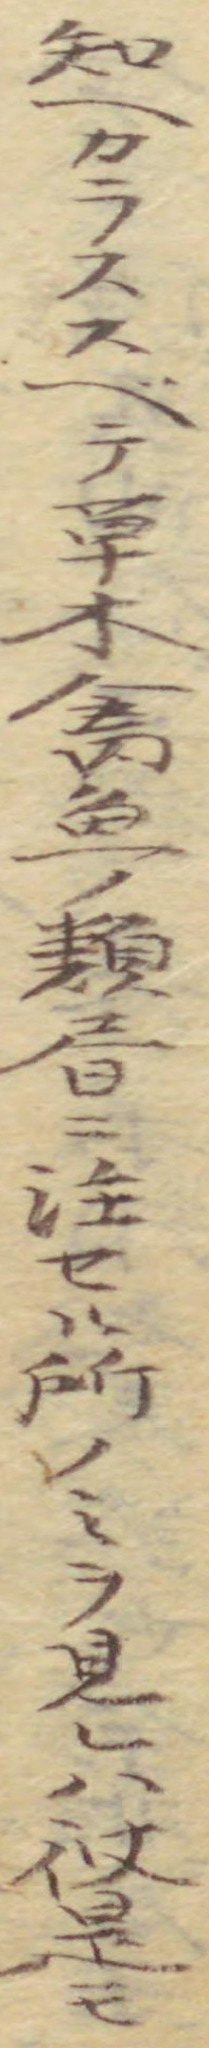知ルヘカラススベテ草木禽魚ノ類書ニ注セル所ノミヲ見レハ彼是モ
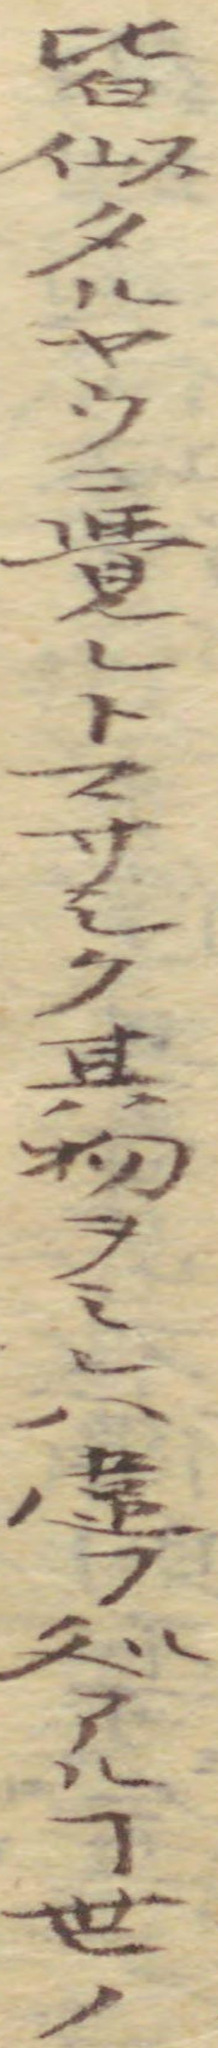皆似タルヤウニ覚レトマサシク其物ヲミレハ違フ処アルコト世ノ
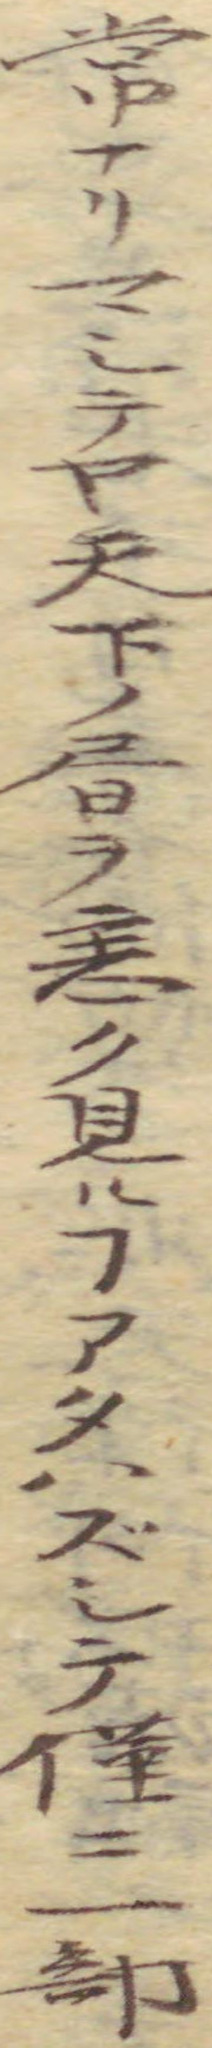常ナリマシテヤ天下ノ書ヲ悉ク見ルコトアタハズシテ僅ニ一部
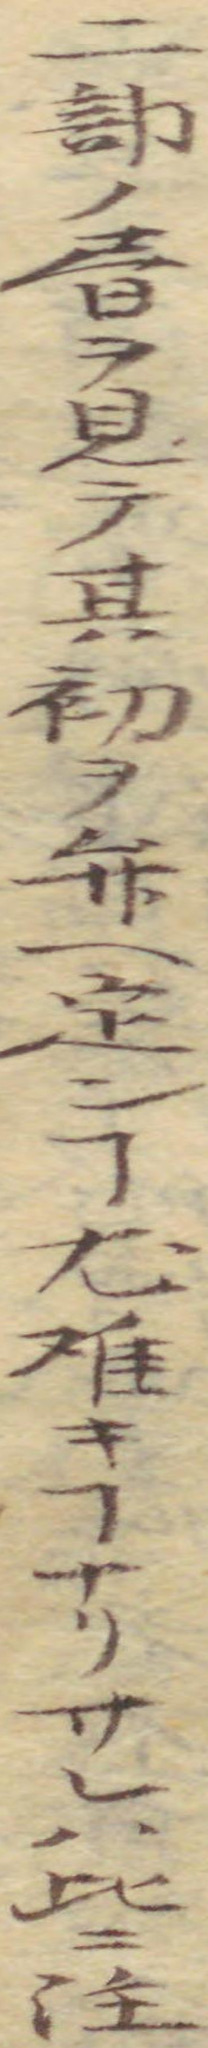二部ノ書ヲ見テ其初ヲ弁ヘ定ンコト尤難キコトナリサレハ此ニ注
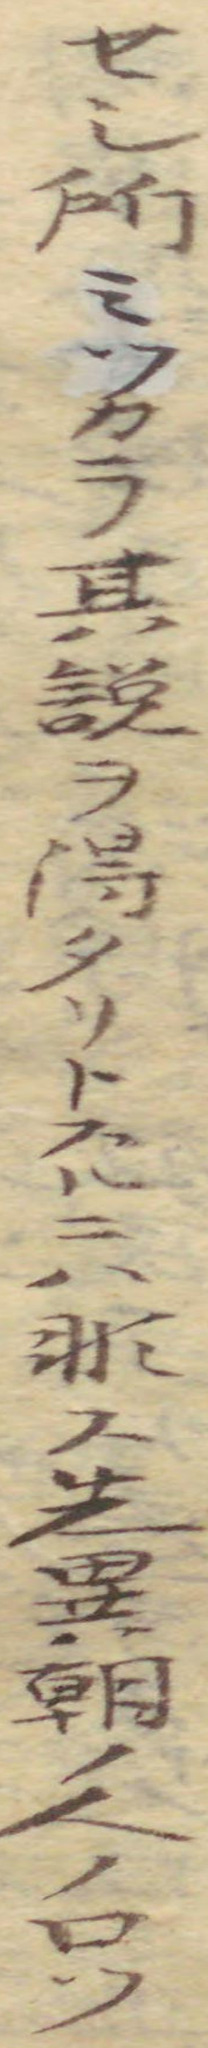セシ所ミツカラ其説ヲ得タリトスルニハ非ス先異朝ノ人ノ口ツ
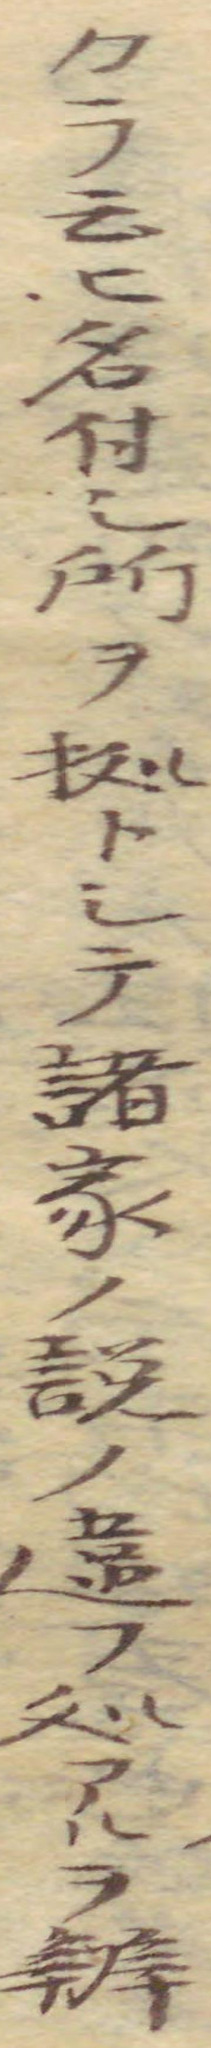カラ云ヒ名付シ所ヲ拠トシテ諸家ノ説ノ違フ処アルヲ弁
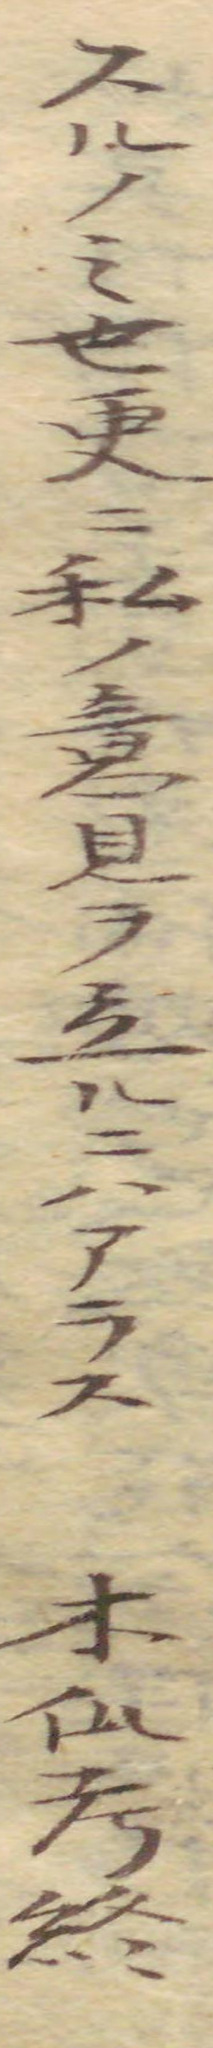スルノミ世更ニ私ノ意見ヲ立ルニハアラス木瓜考終

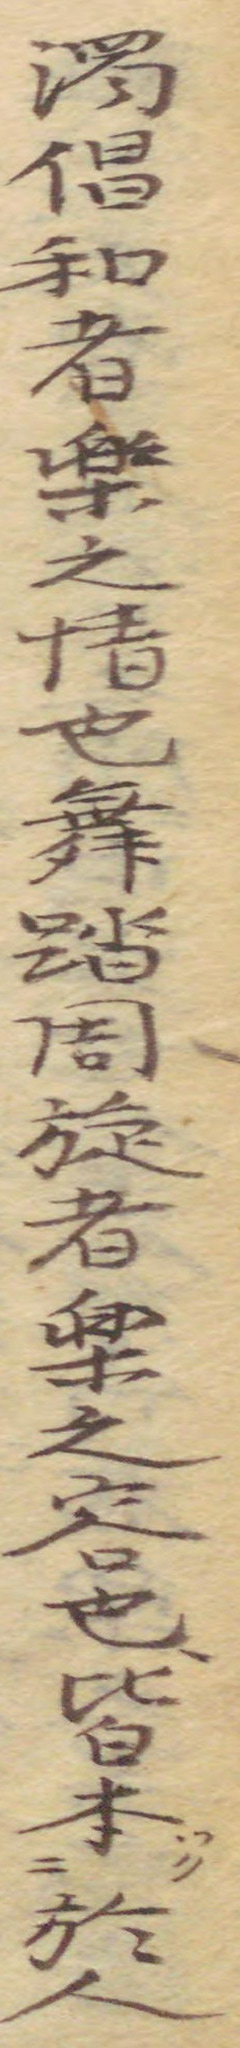濁倡和者楽之情也舞踏周旋者楽之容也、皆本於人
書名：鶯宿雑記. 巻263-264
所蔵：国立国会図書館 National Diet Library, JAPAN
